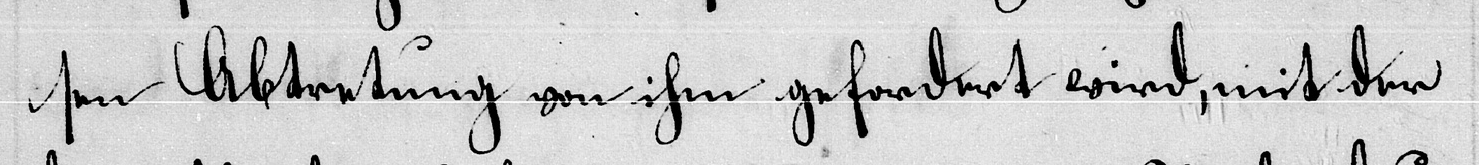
sen Abtretung von ihm gefordert wird, mit der
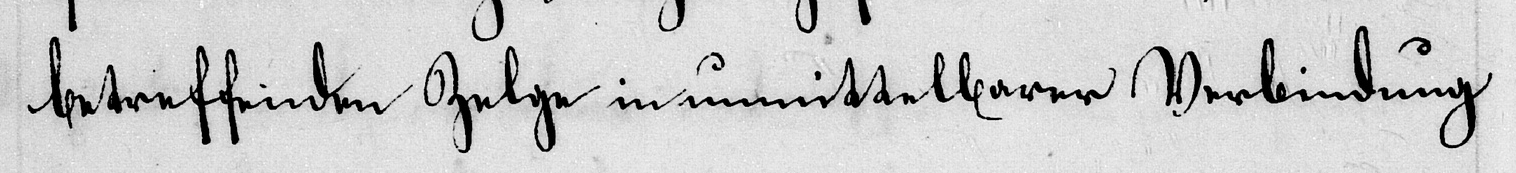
betreffenden Zelge in unmittelbarer Verbindung
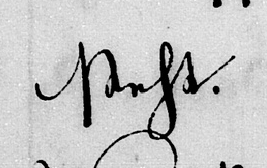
steht.
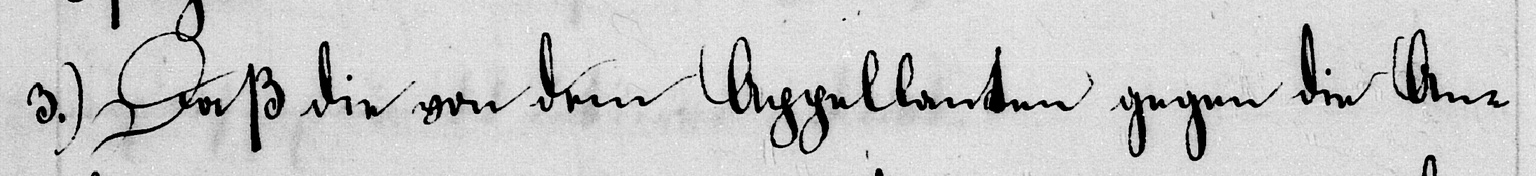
3.) Daß die von dem Appellanten gegen die An¬
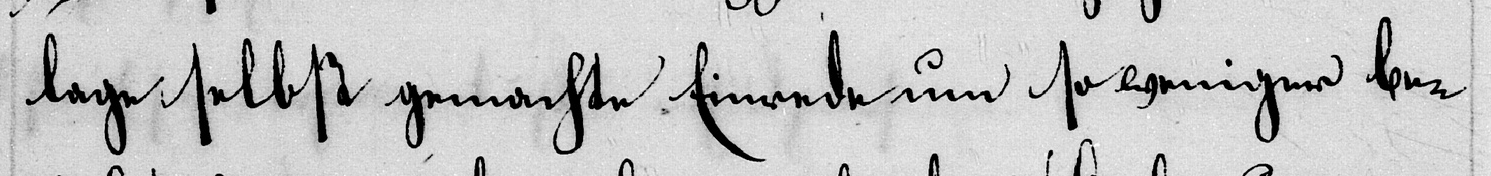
lage selbst gemachte Einrede um so weniger be¬
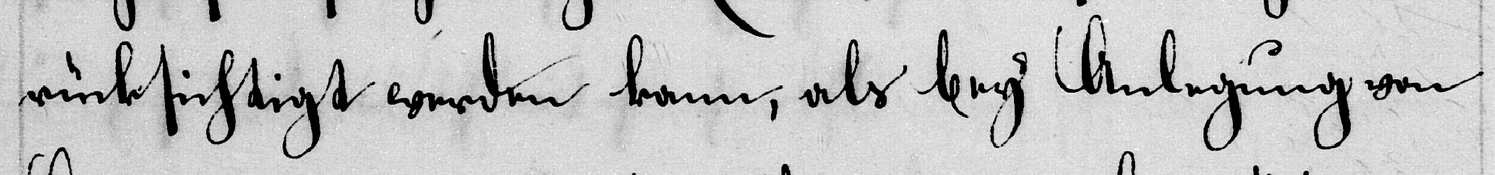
rücksichtigt werden kann, als bey Anlegung von
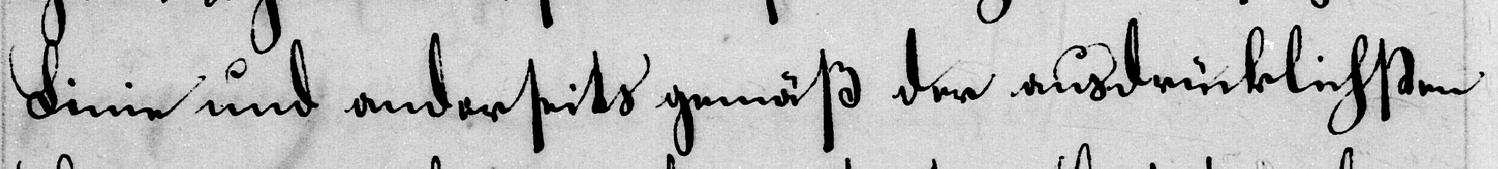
Linie und anderseits gemäß der ausdrücklichsten
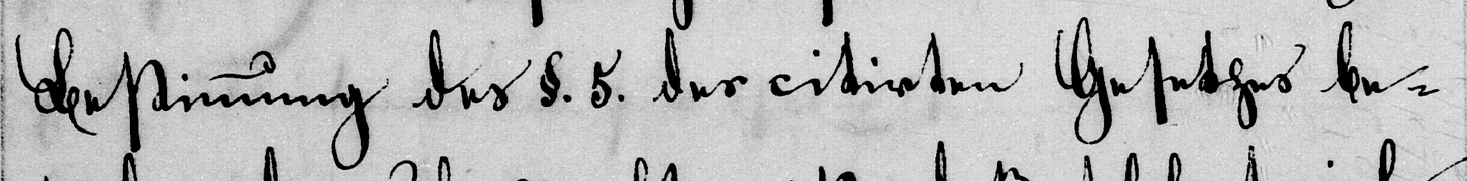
Bestimmung des §. 5. des citirten Gesetzes be¬
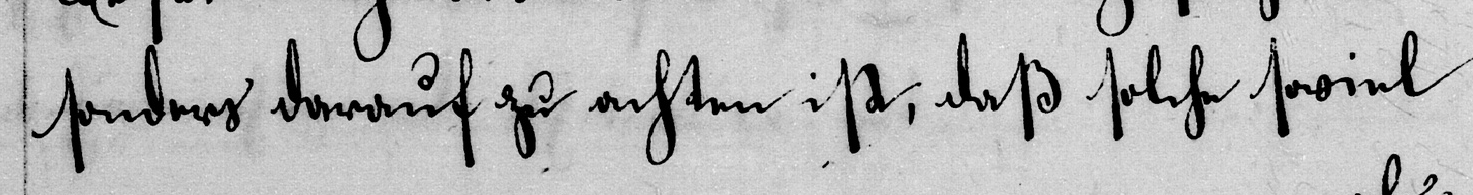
sonders darauf zu achten ist, daß solche soviel
